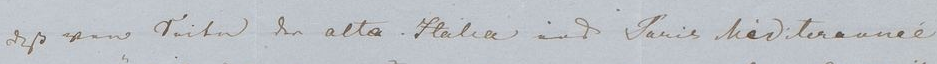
Daß von Seite der alta Italia und Paris Méditeranneé
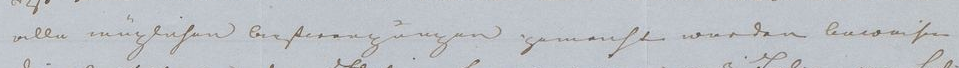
alle möglichen Anstrengungen gemacht werden beweisen
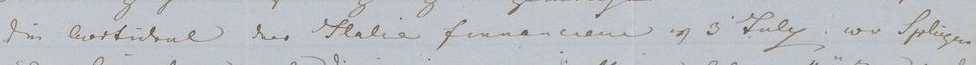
die Artikel der Italie financiere vom 3t July, wo Splügen
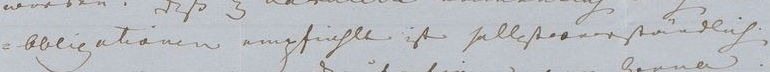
Obligationen empfiehlt ist selbstverständlich.
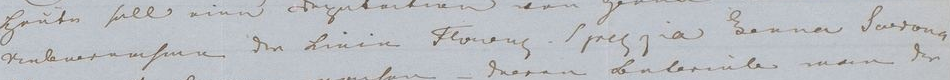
Uebernahme der Linie Florenz–SpezziaGenuaSavona–
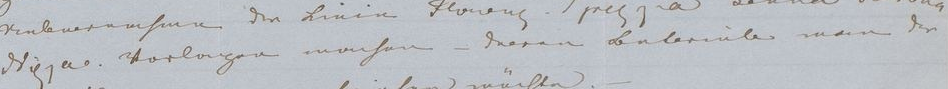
Nizza – Vorlagen machen – deren Betrieb man der
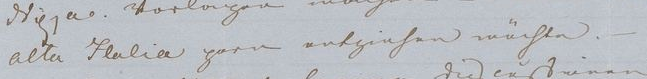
alta Italia gern entziehen möchte. –
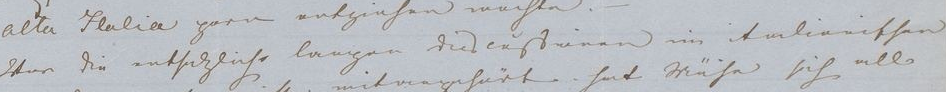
Wer die entsetzlich langen Discussionen im italienischen
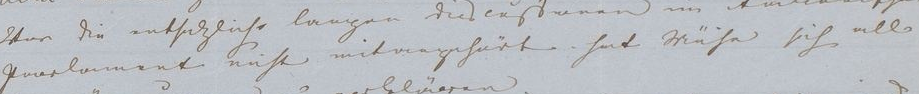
Parlament nicht mitangehört – hat Mühe sich all
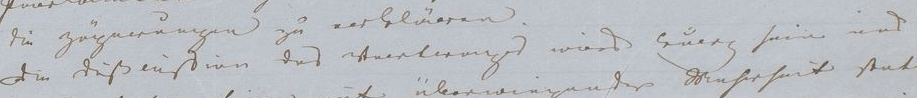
Die Dißcussion des Vertrags wird kurz sein und
